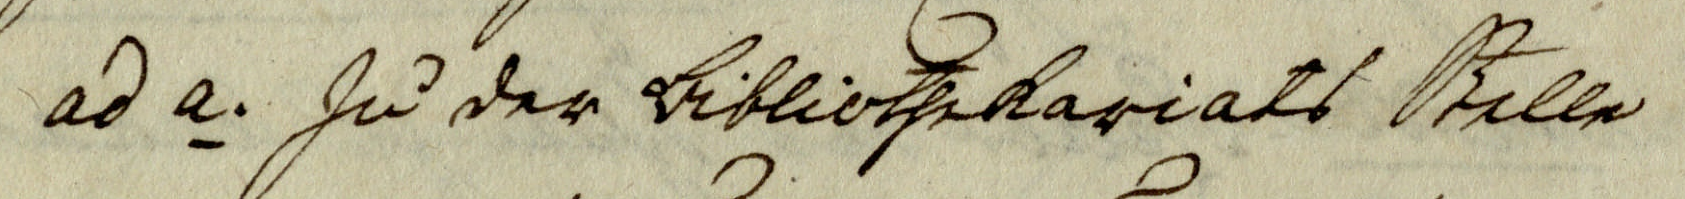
ad a. zu der Bibliothekariats Stelle
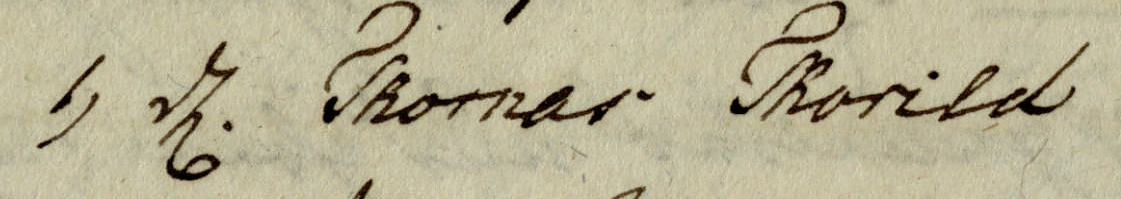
1., dh. Thomas Thorild
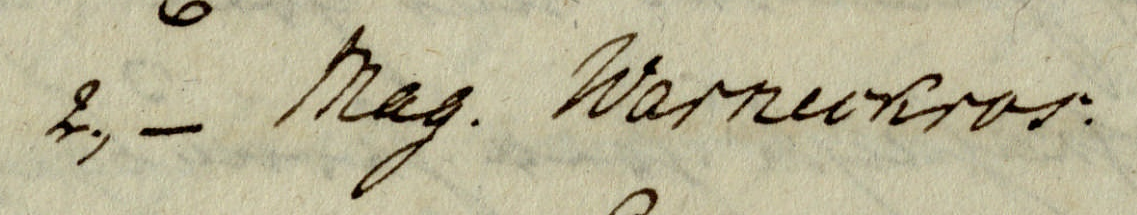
2., — Mag. Warneckros
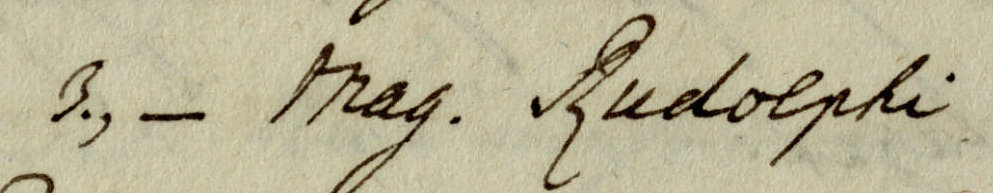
3., — Mag. Rudolphi
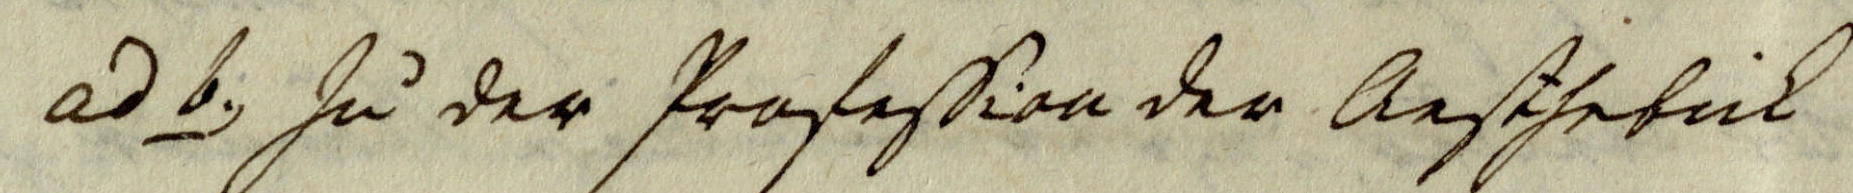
ad b., zu der Profession der Aesthetick
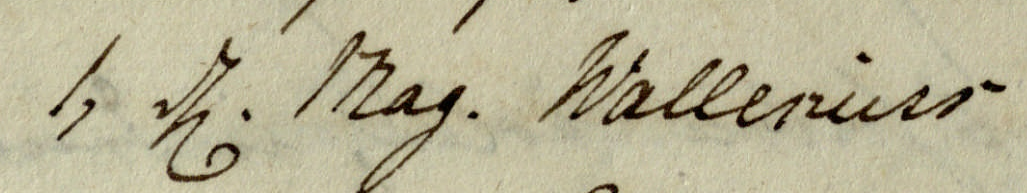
1., dh. Mag. Wallenius
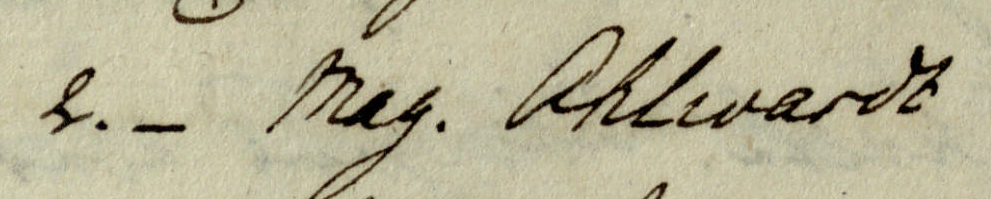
2. — Mag. Ahlwardt
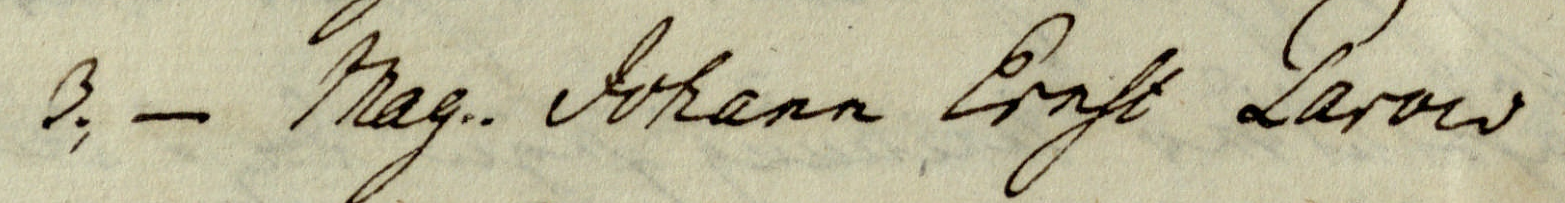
3., — Mag. Johann Ernst Larow
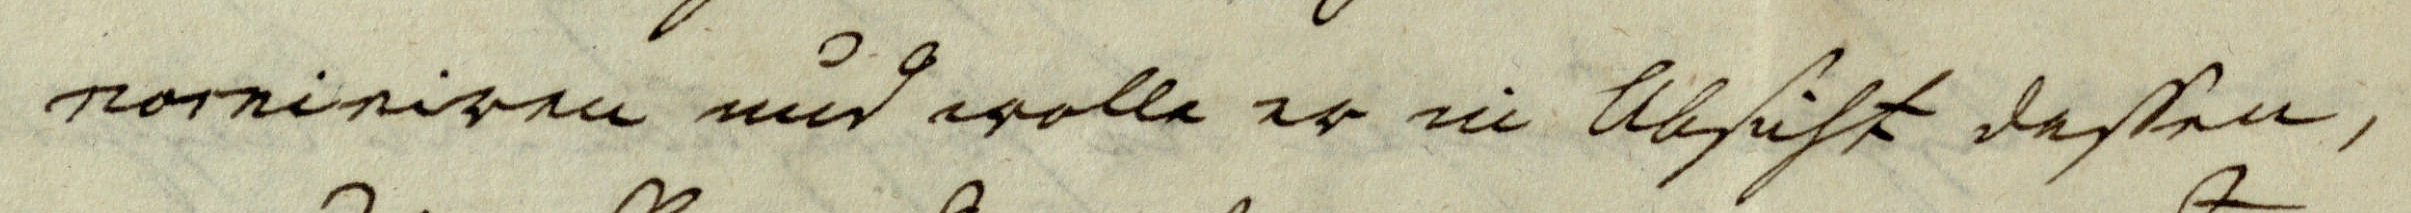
nominiren und wolle er in Absicht dessen,
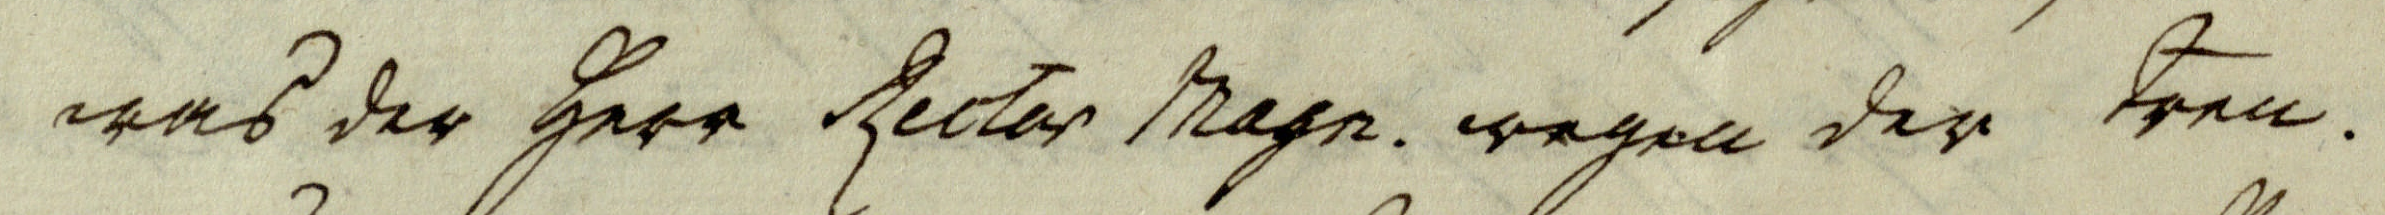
was der Herr Rector Magn. wegen der Tren¬
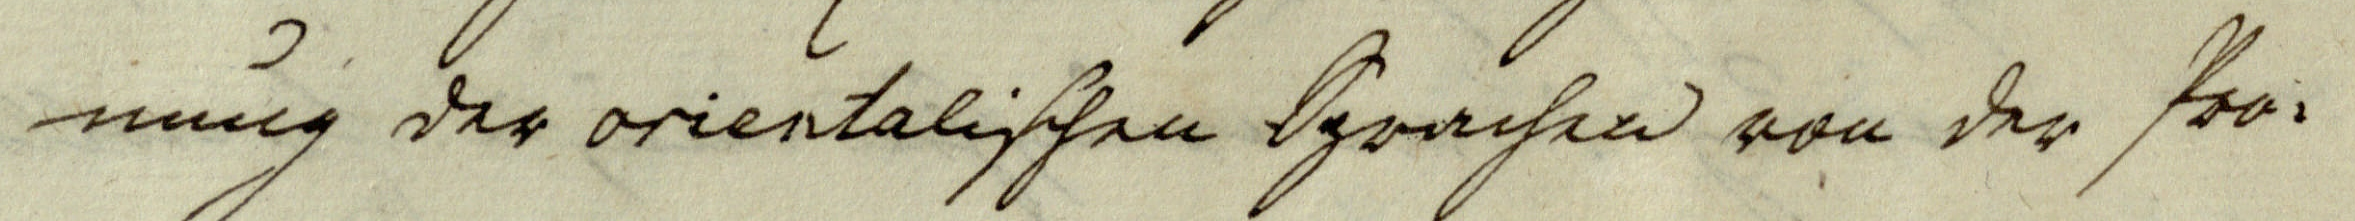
nung der orientalischen Sprachen von der Pro¬
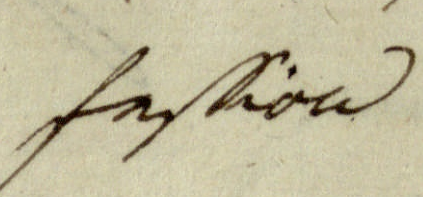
fession
